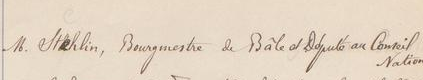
M. Stehlin, Bourgmestre de Bâle et Député au Conseil
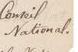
National.
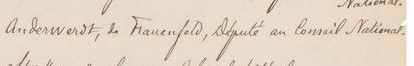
Anderwerdt, de Frauenfeld, Député au Conseil National.
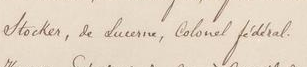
Stocker, de Lucerne, Colonel fédéral.
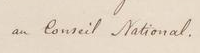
au Conseil National.
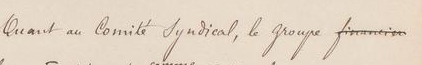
Quant au Comité Syndical, le Groupe financier
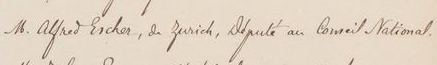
M. Alfred Escher, de Zurich, Député au Conseil National.
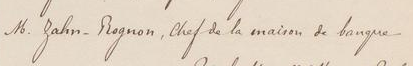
M. Zahn-Rognon, Chef de la maison de banque
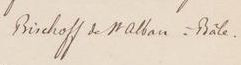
Bischoff de St Alban à Bâle.
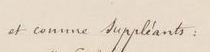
et comme Suppléants:
